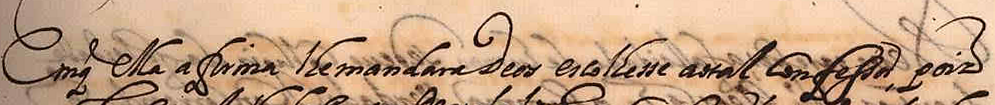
Em q̄ ella affirma lhe mandara Deos escolhesse ao tal Confessor, poiz
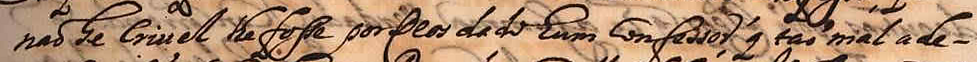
naõ he criuel lhe fosse por Deos dado hum Confessor, q̄ taõ mal a de
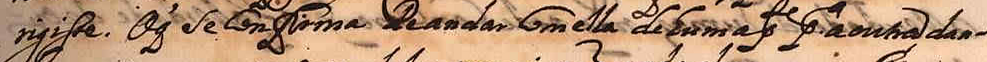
rigisse. O q̄ se confirma de andar Com ella de huma p.te p.a a outra dan
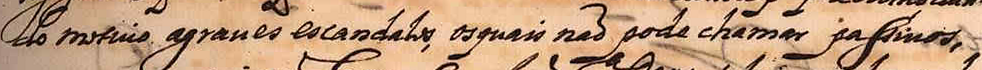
do motiuo a graues escandalos, os quais naõ pode chamar passiuos,
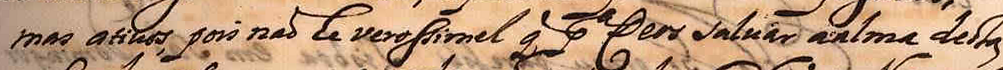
mas atiuos, pois naõ he verosimel, q̄ p.a Deos saluar a alma desta
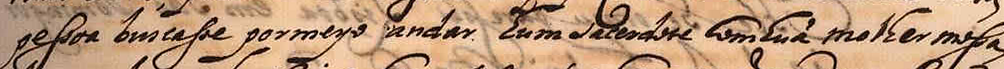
pessoa buscasse por meyo andar hum sacerdote Com huā molher mossa
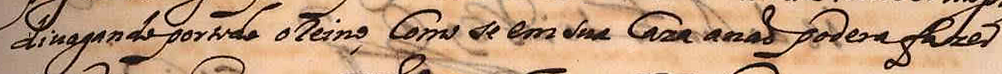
diuagando por todo o Reino, Como se em sua Caza a naõ podera fazer
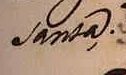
Santa;
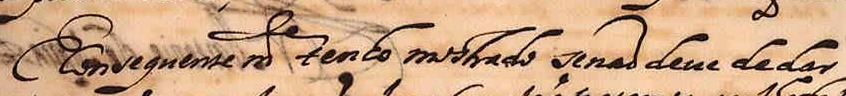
E Consequentemte tenho mostrado se naõ deue de dar
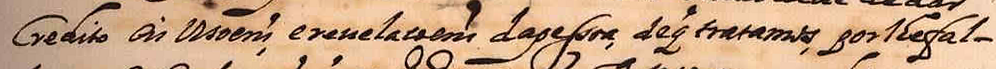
Credito às visoen̄s, e reuelaçoen̄s da pessoa, de q̄ tratamos, por lhe fal
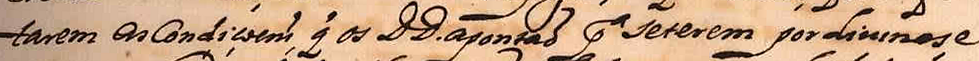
tarem as condiçoens̄, q̄ os DD. apontaõ pa se terem por diuinas, e
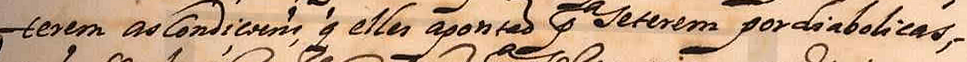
terem as condiçoen̄s, q̄ elles apontaõ pa se terem por diabolicas,
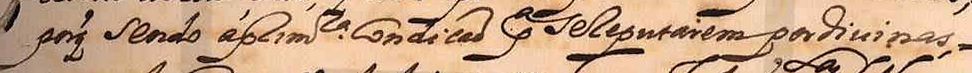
porq̄ sendo a pRim.ra condiçaõ pa se Reputarem por diuinas,
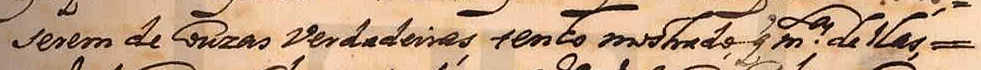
serem de Couzas verdadeiras, tenho mostrado, q̄ m.tas dellas
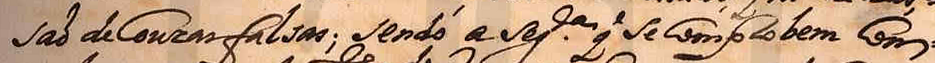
saõ de Couzas falsas; sendo a seg.da q̄ se compRobem Com
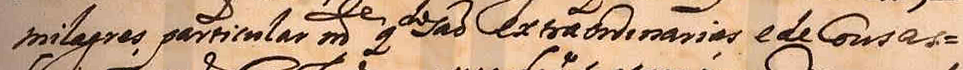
milagres, particularmte qdo saõ extraordinarias, e de Cousas
